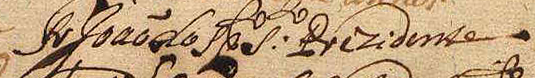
Fr Joaõ do Spto S.to Prezidente
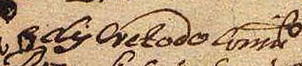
e discreto do conuto
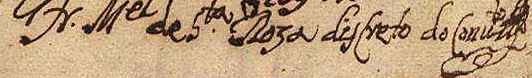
Fr. Mel de S.ta Roza disCreto do Conuto
